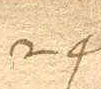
24
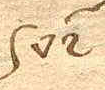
Sor̄
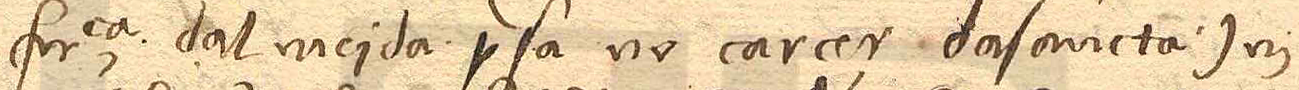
frça dalmejda p̄sa no carçer da sancta Jm
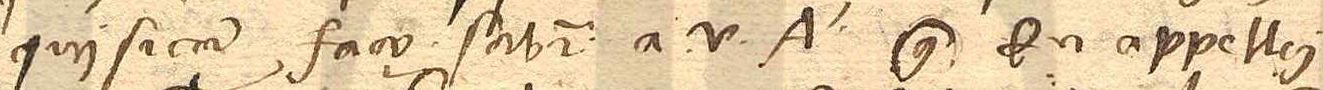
qujsiçā faço sabr̄ a .v. A q̄ Eu appellej
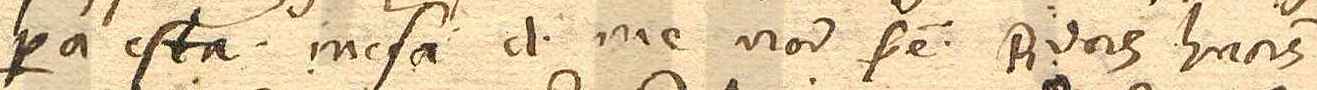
ꝑa esta. mesa d. me nā ꞩē. Rdas huas̄
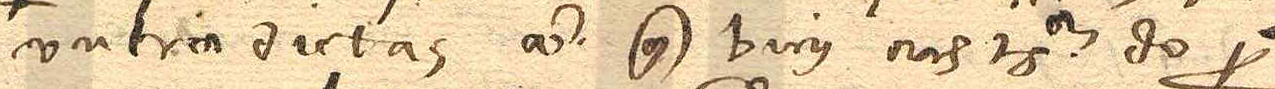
contradictas cō q̄ vim aas tsas do ꝓo
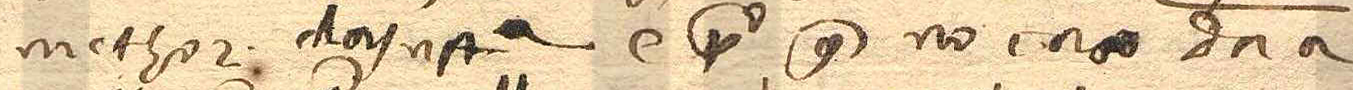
methor. da Justa e p̄oq̄ no caso da a
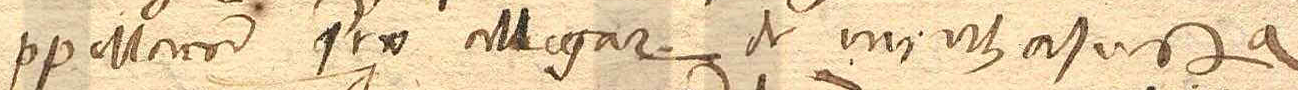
ppellacā q̄ro allegar de minha Justa
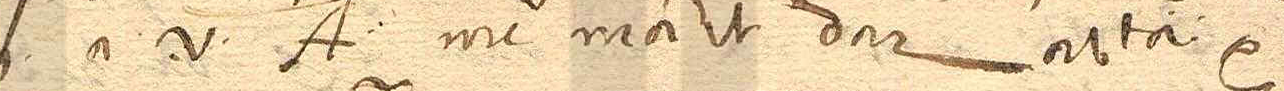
.p. a .V. A me māde dar a vta e
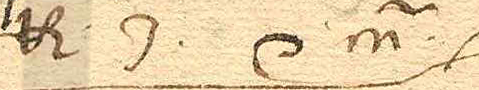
Rꝭ J. e m̄. /
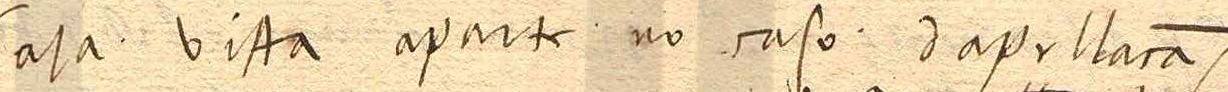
aja vista a parte no caso dapellaçā /
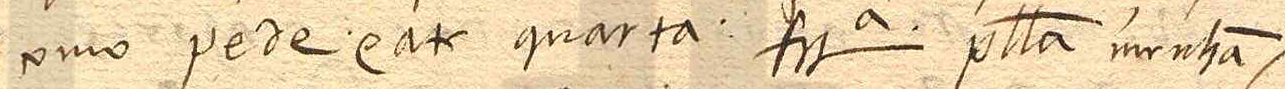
como pede e ate quarta frra p̄lla menhā /
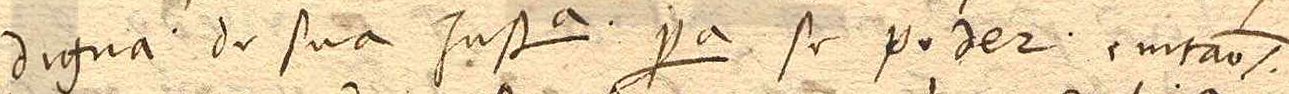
digua de sua Justa ꝑa se poder então /.
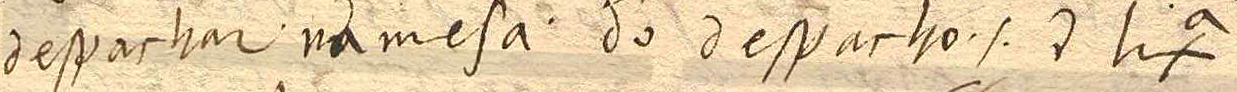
despachar na mesa do despacho ./. ē lixa
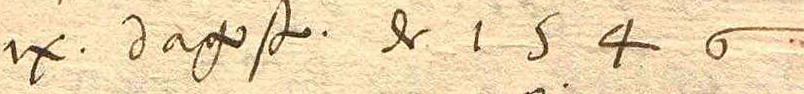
ix. dagosto. de 1546
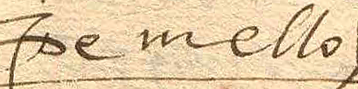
Jo de mello
